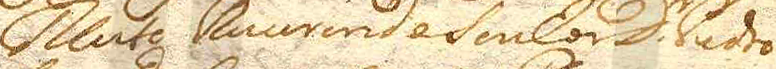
Muto Reuerendo Senhor D.r Pedro
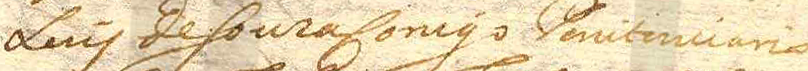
Luis de souza Conego Penitenciario
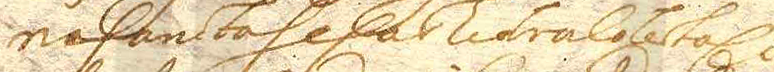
na sancta se Cathedral desta Ci
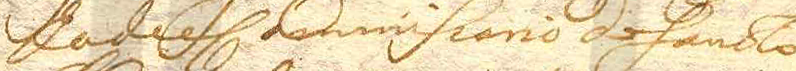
dade e Commisario do sancto
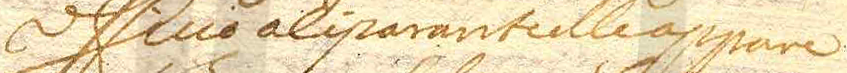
offiçio ahi parante elle appare
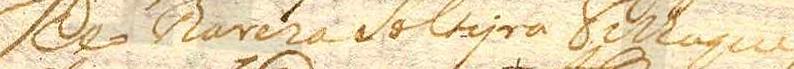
ceo Thareza Solteyra filha que
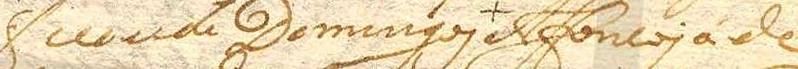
ficou de Domingos Affonco ja de
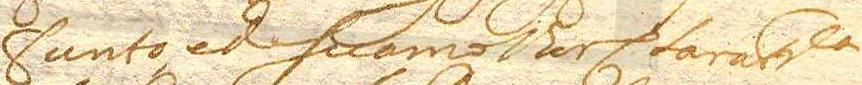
funto, e de sua molher Clara Frca
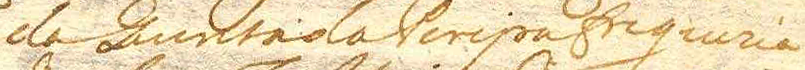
da Quinta da Perejra freguezia
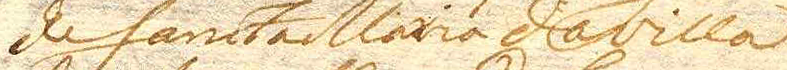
de sancta Maria da villa
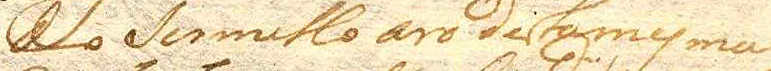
do Iermello aro desta mesma
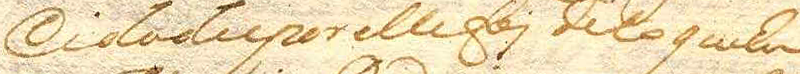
Cidade e por elle foj dito que hu
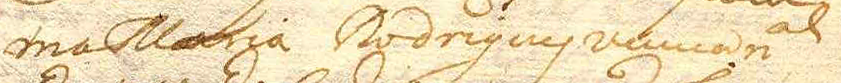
ma Maria Rodrigues veuua nal
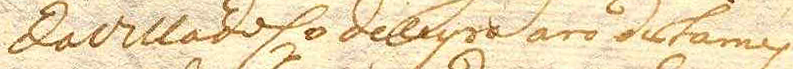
da vila do Codeceyro aro desta mes
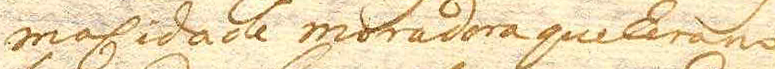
ma Cidade moradora que hera no
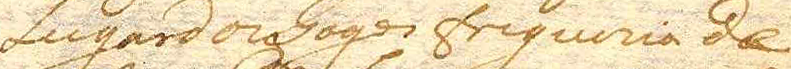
Lugar dos Gagos freguezia de
